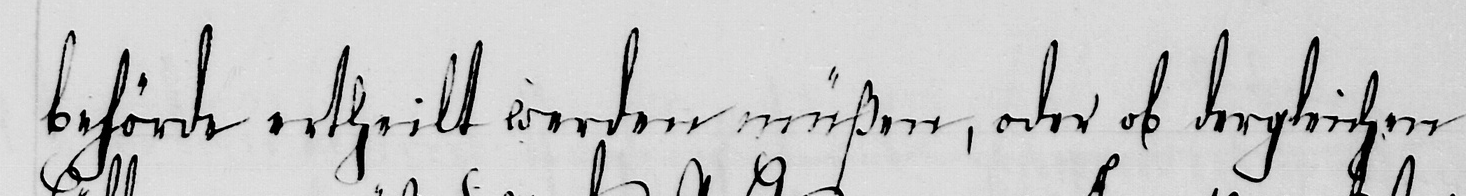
behörde ertheilt werden müßen, oder ob dergleichen
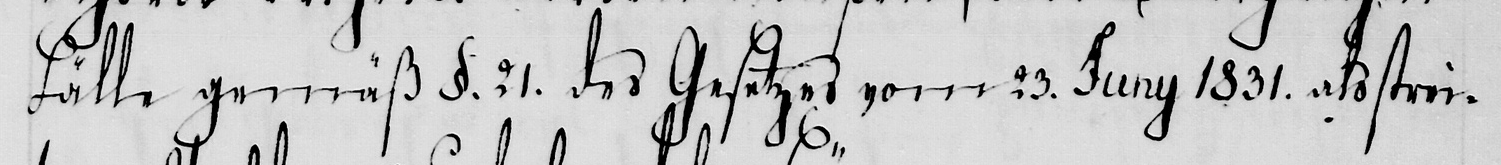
Fälle gemäß §. 21. des Gesetzes vom 23. Juny 1831. als strei¬
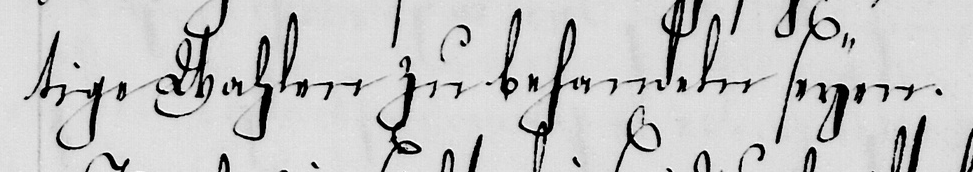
tige Wahlen zu behandeln seyen.
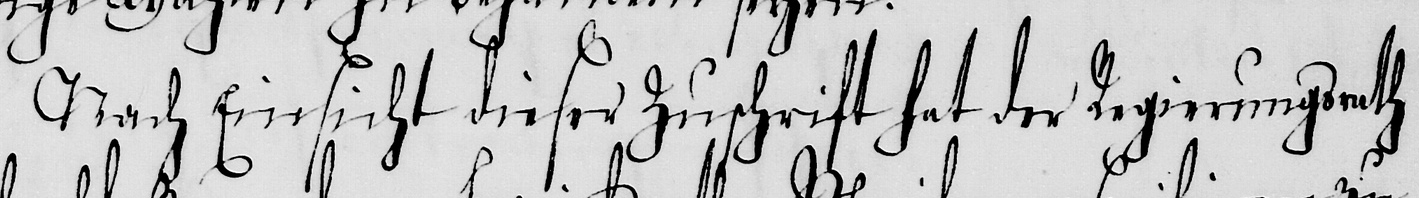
Nach Einsicht dieser Zuschrift hat der Regierungsrath
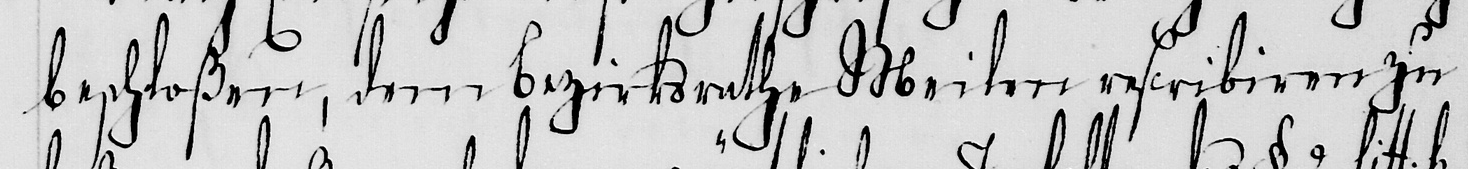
beschloßen, dem Bezirksrathe Meilen rescribiren zu
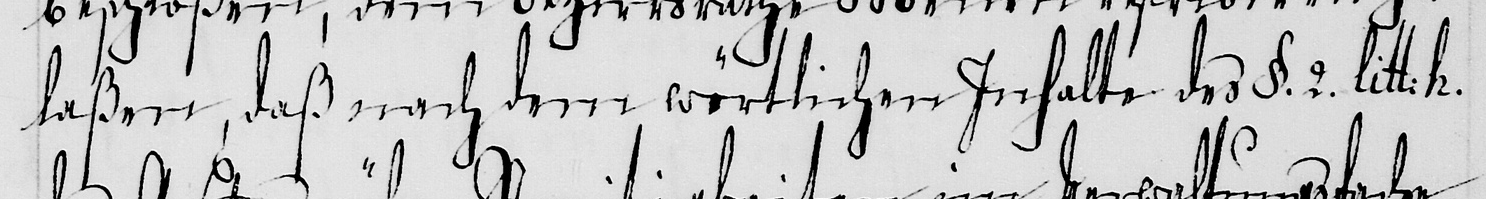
laßen, daß nach dem wörtlichen Inhalte des §. 2. lit¬
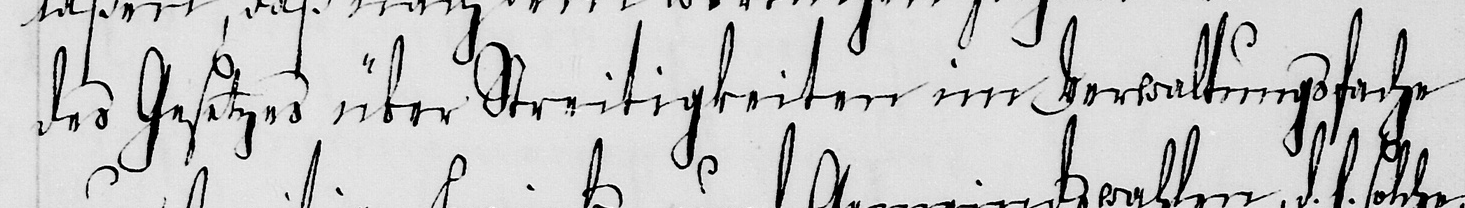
des Gesetzes über Streitigkeiten im Verwaltungsfache
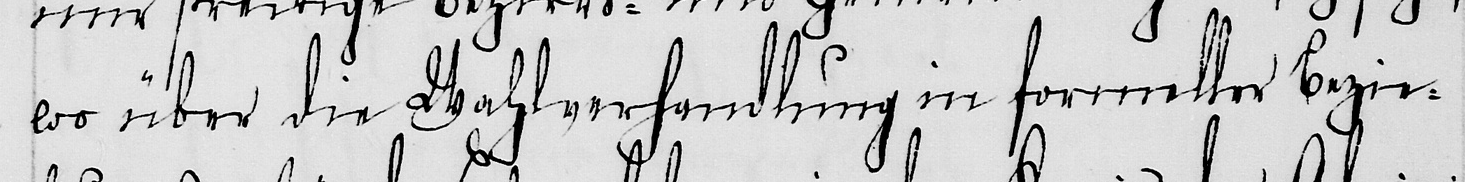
wo über die Wahlverhandlung in formeller Bezie¬
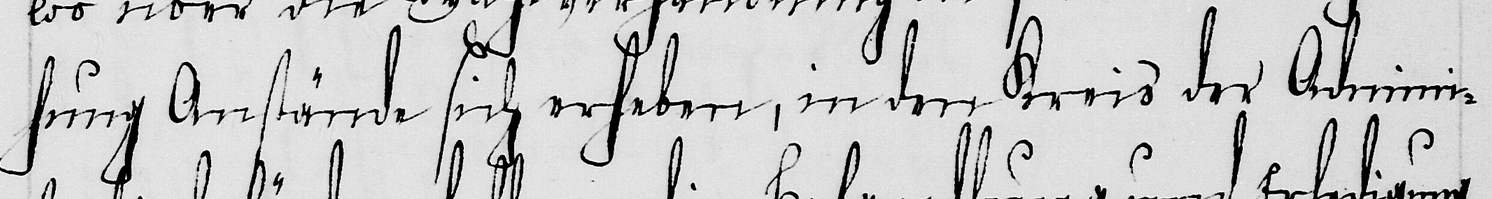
hung Anstände sich erheben, in den Kreis der Admini¬
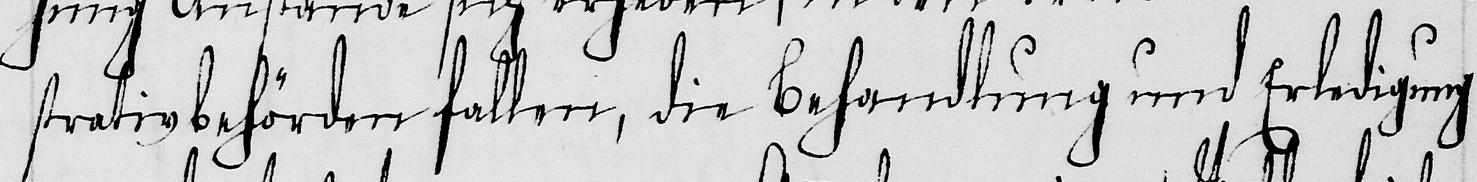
strativbehörden fallen, die Behandlung und Erledigu¬
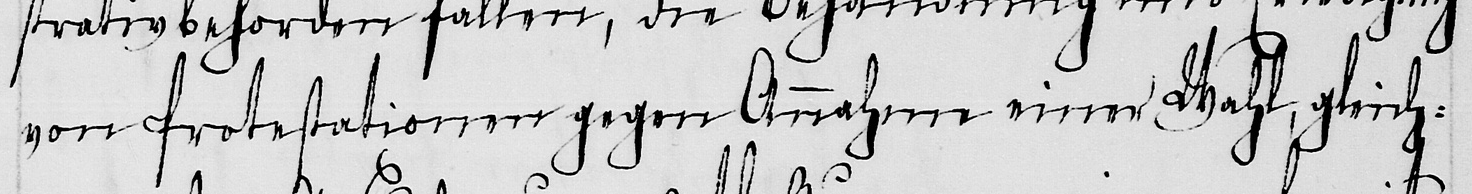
von Protestationen gegen Annahme einer Wahl, gleich¬
